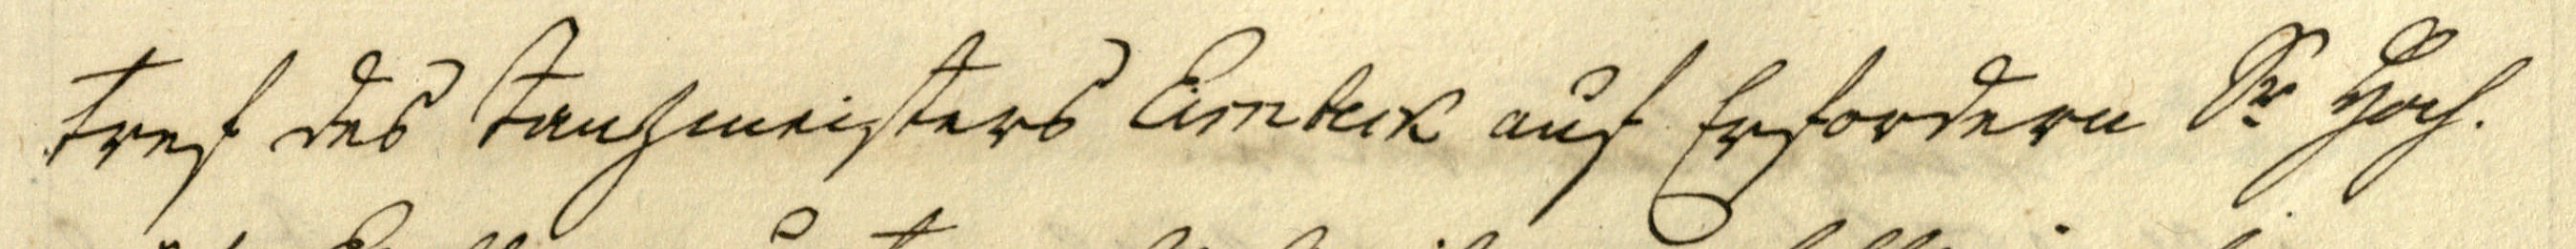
tref des Tanzmeisters Eimbeck auf Erfordern Sr. hoch-
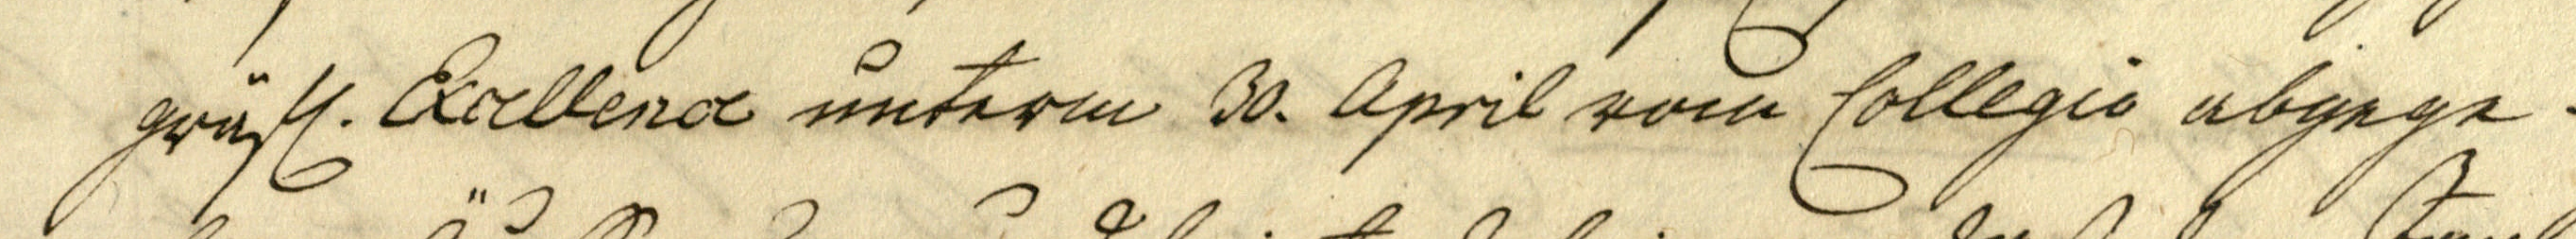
gräfl. Excellence unterm 30. April vom Collegio abgege-
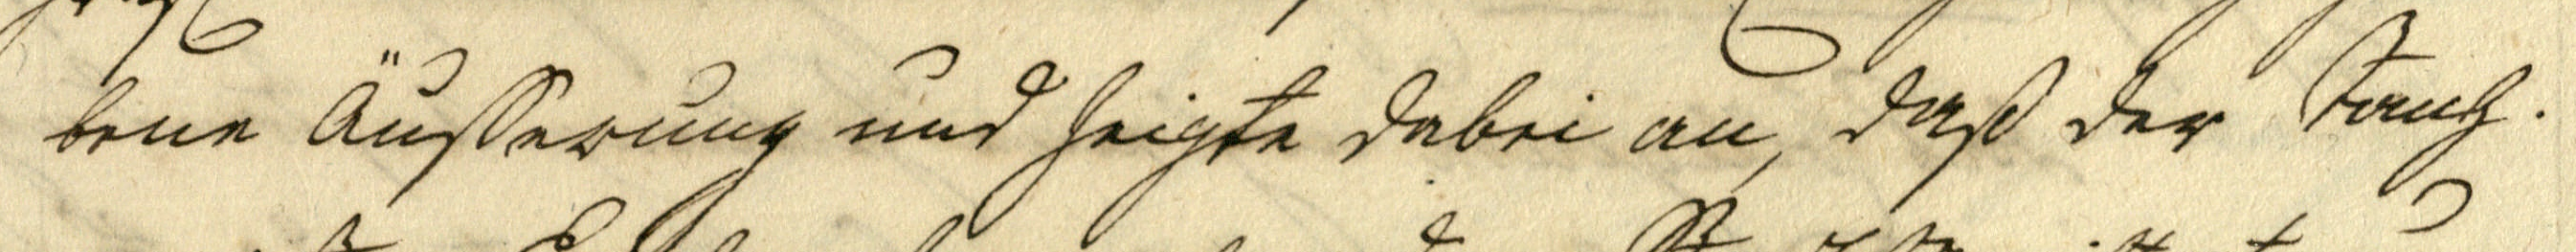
bene Äusserung und zeigte dabei an, daß der Tanz-
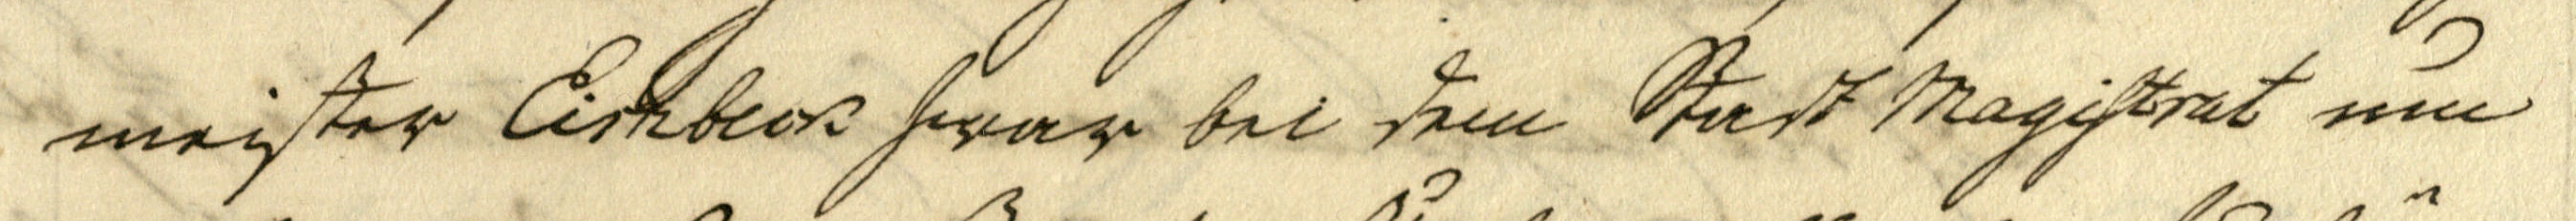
meister Eimbeck zwar bei dem Stadt Magistrat um
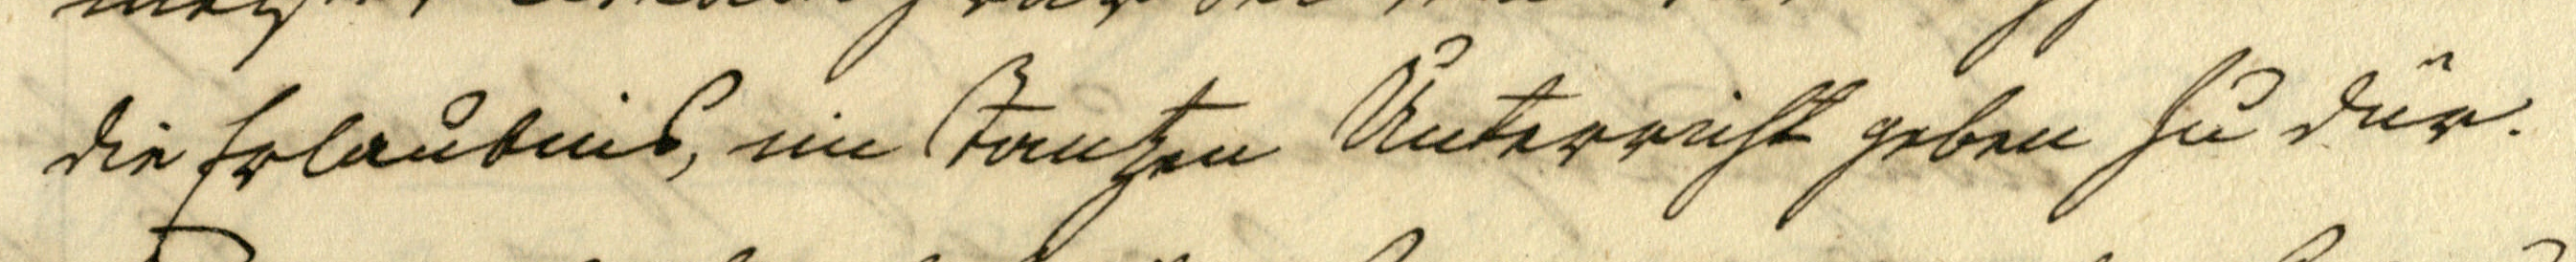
die Erlaubnis, im Tantzen Unterricht geben zu dür-
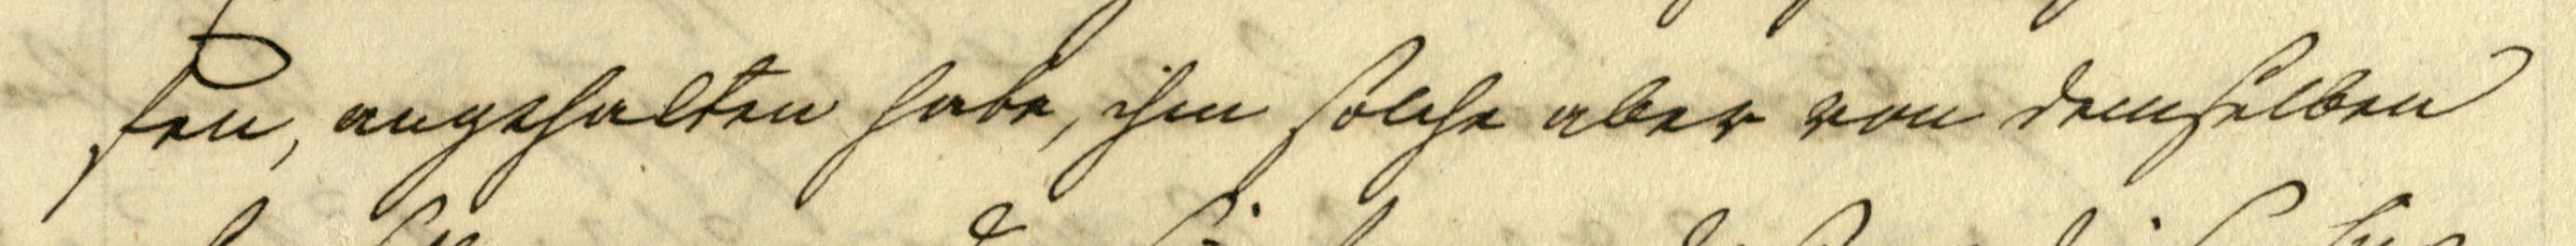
fen, angehalten habe, ihm solche aber von demselben
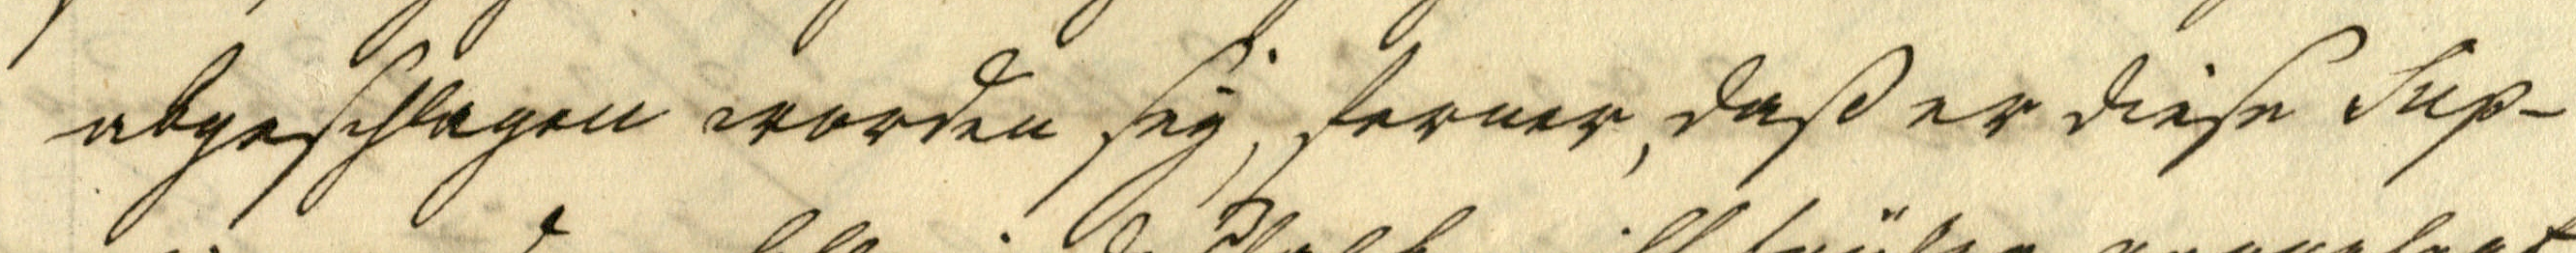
abgeschlagen worden sey, ferner, daß er diese Sup-
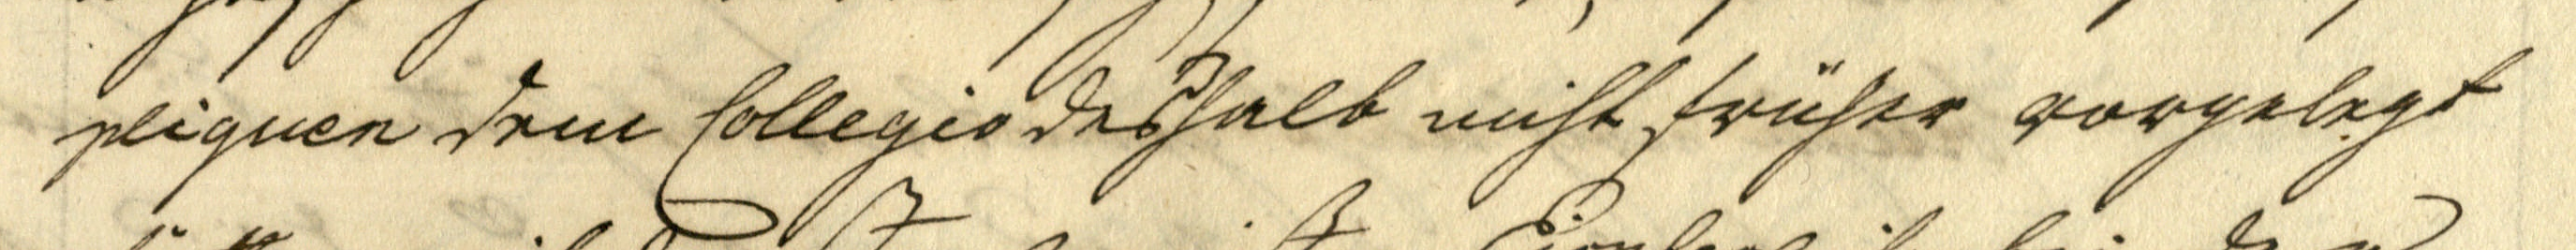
pliquen dem Collegio deshalb nicht früher vorgelegt
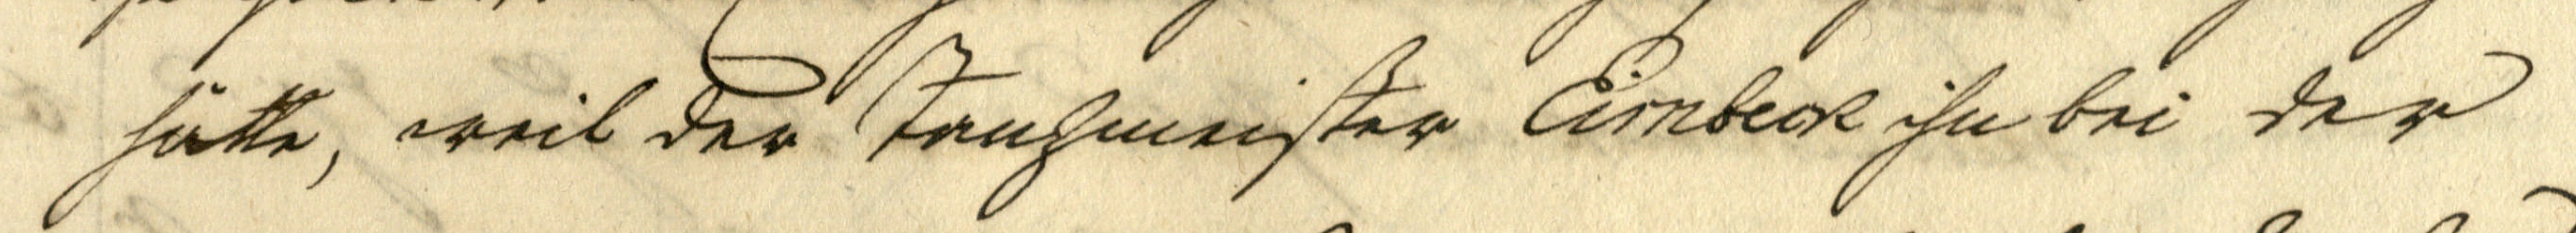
hätte, weil der Tanzmeister Eimbeck ihn bei der
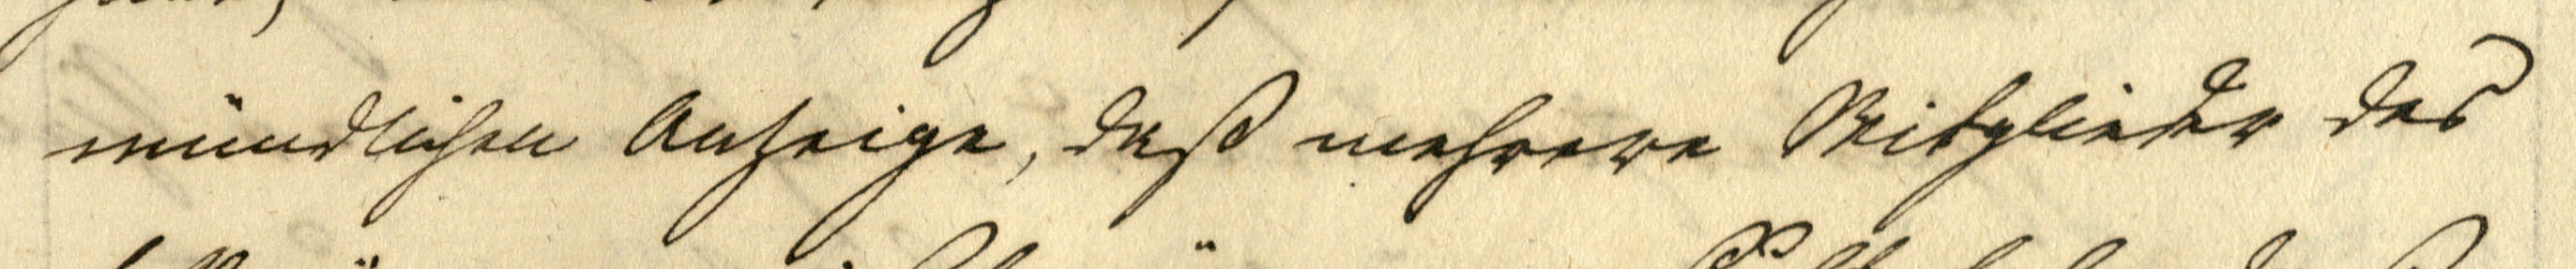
mündlichen Anzeige, daß mehrere Mitglieder des
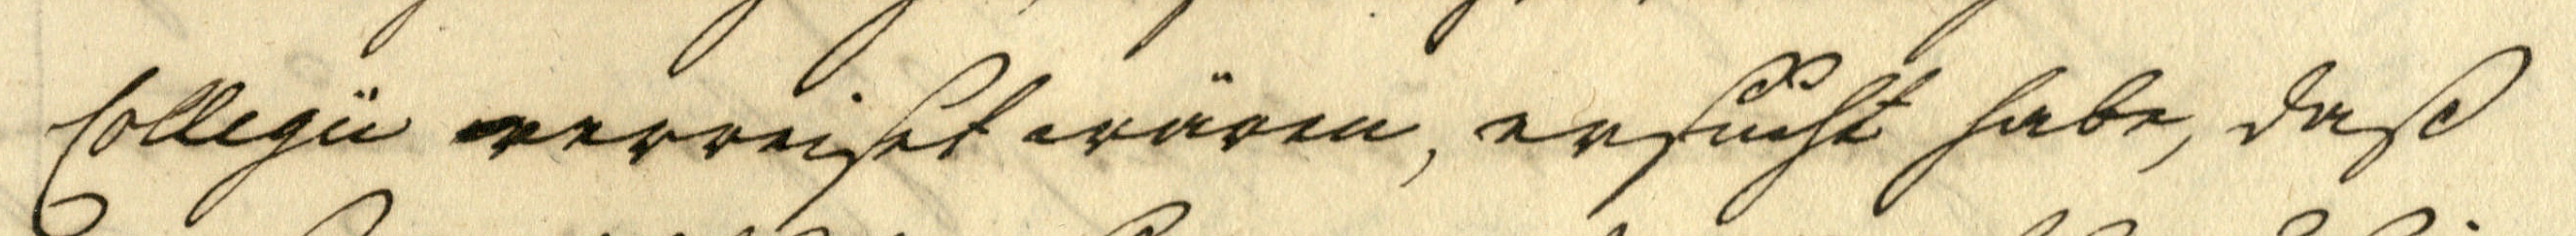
Collegii verreiset wären, ersucht habe, daß
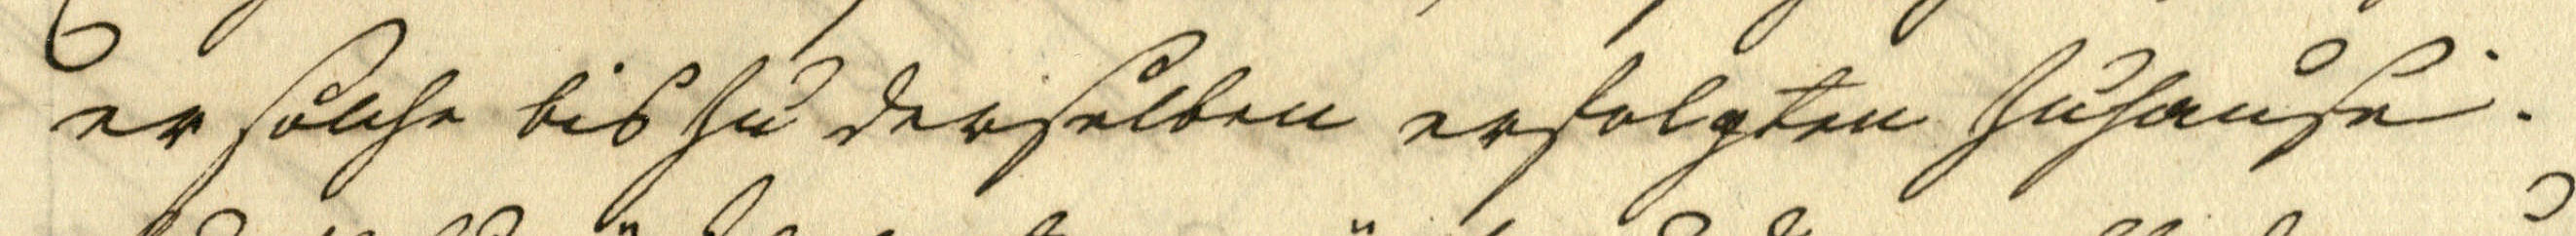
er solche bis zu derselben erfolgten Zuhause-
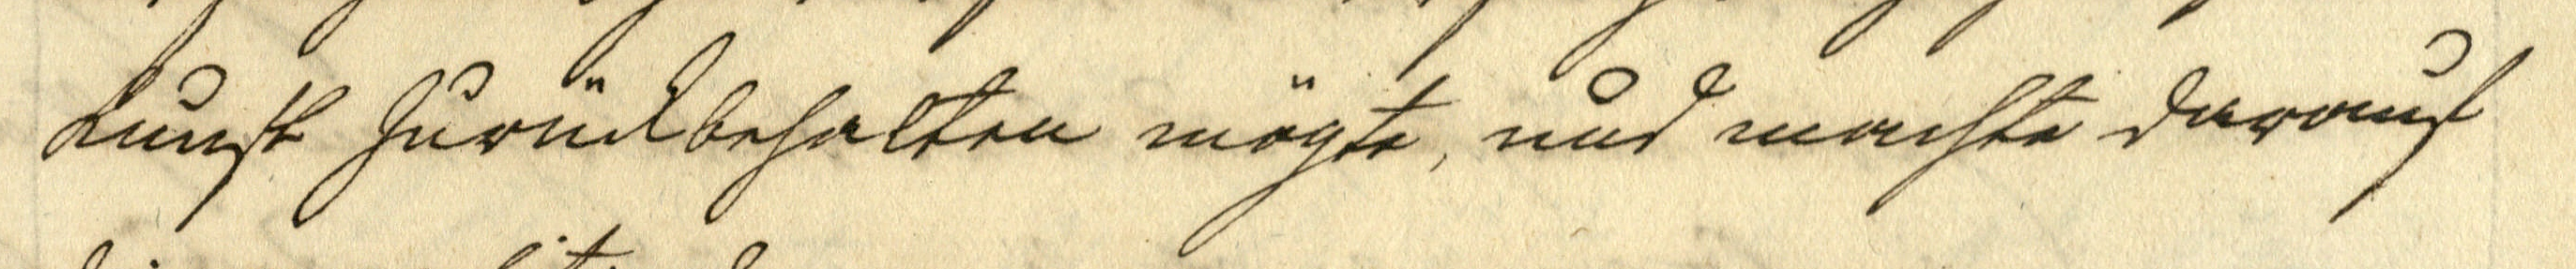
kunft zurückbehalten mögte, und machte darauf
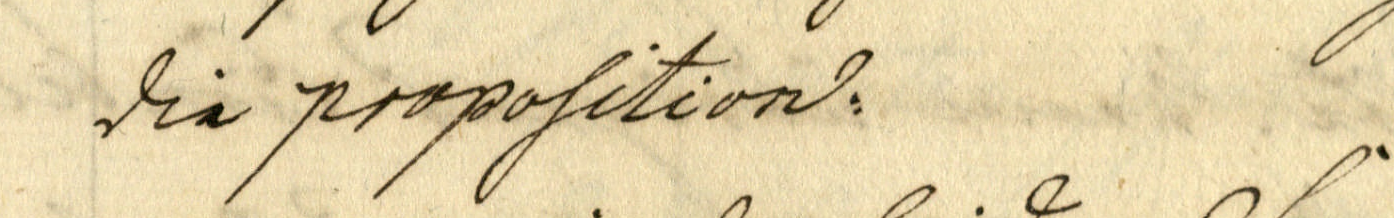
die proposition:
